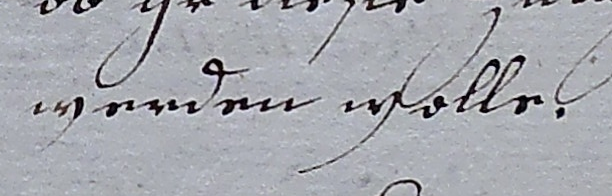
werden wolle.
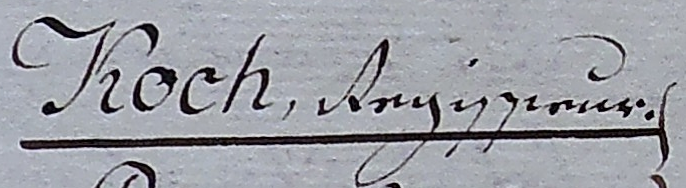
Koch, Regisseur.
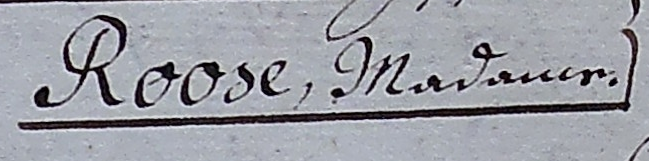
Roose, Madame.
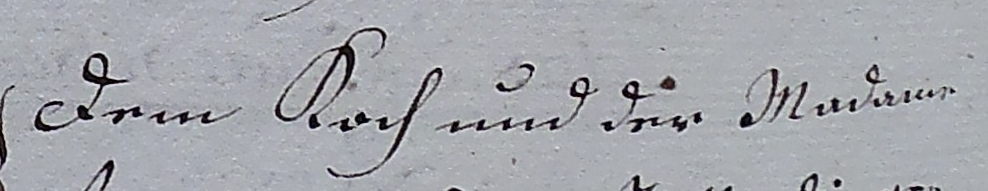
Dem Koch und der Madame
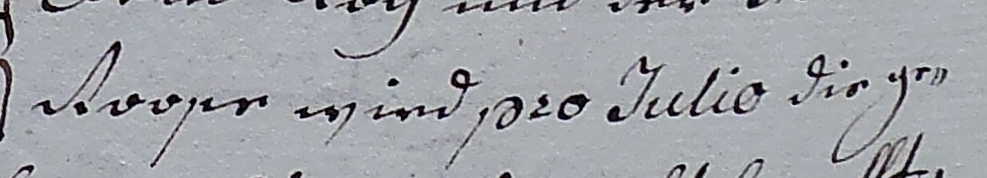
Roose wird pro Julio die ge¬
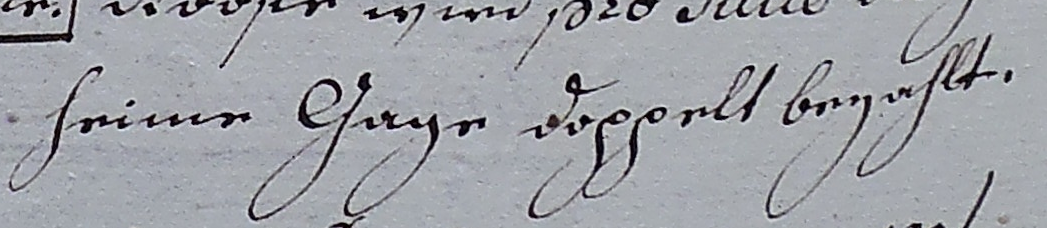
heime Gage doppelt bezahlt.
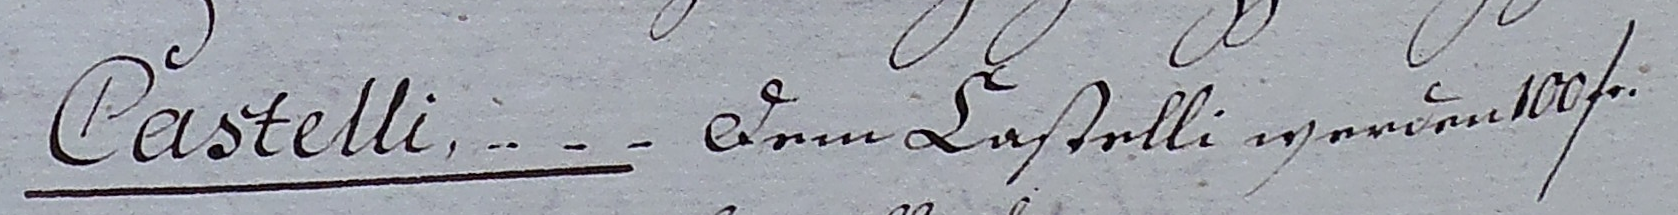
Castelli, .. .. .. Dem Castelli werden 100fr.
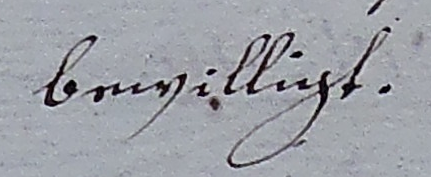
bewilligt.
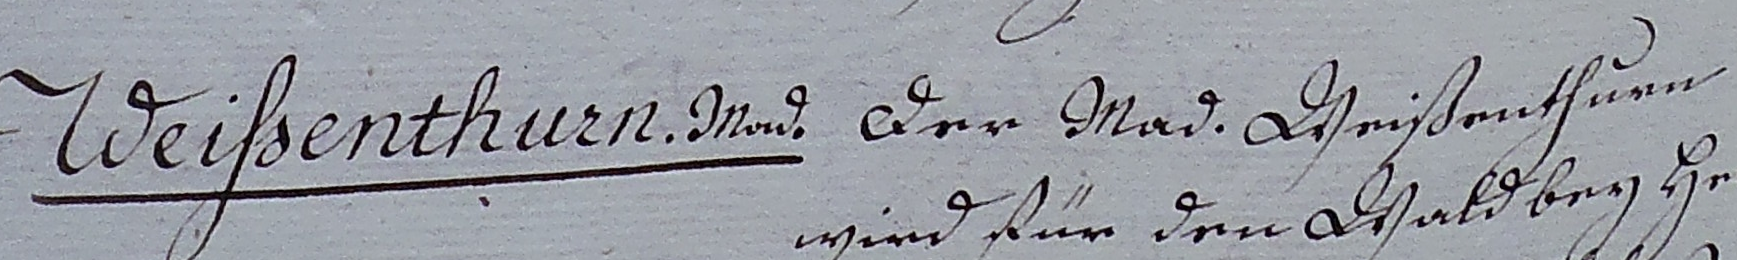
Weissenthurn, Mad. Der Mad. Weißenthurn
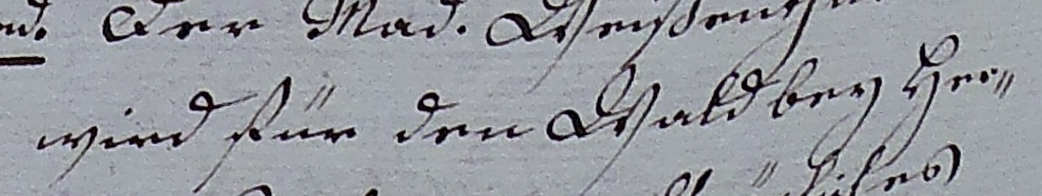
wird für den Wald bey Her¬
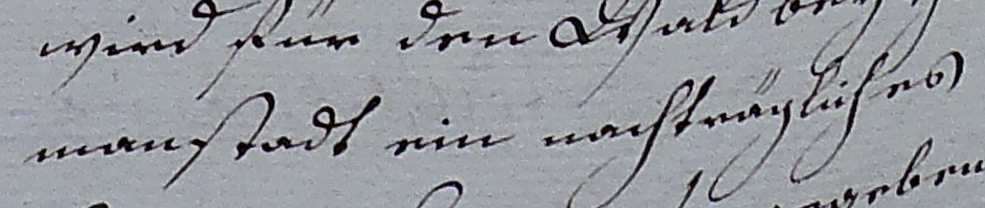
manstadt ein nachträgliches
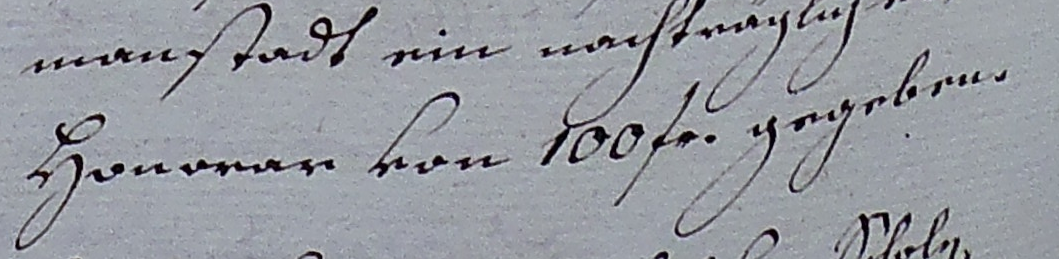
Honorar von 100fr. gegeben.
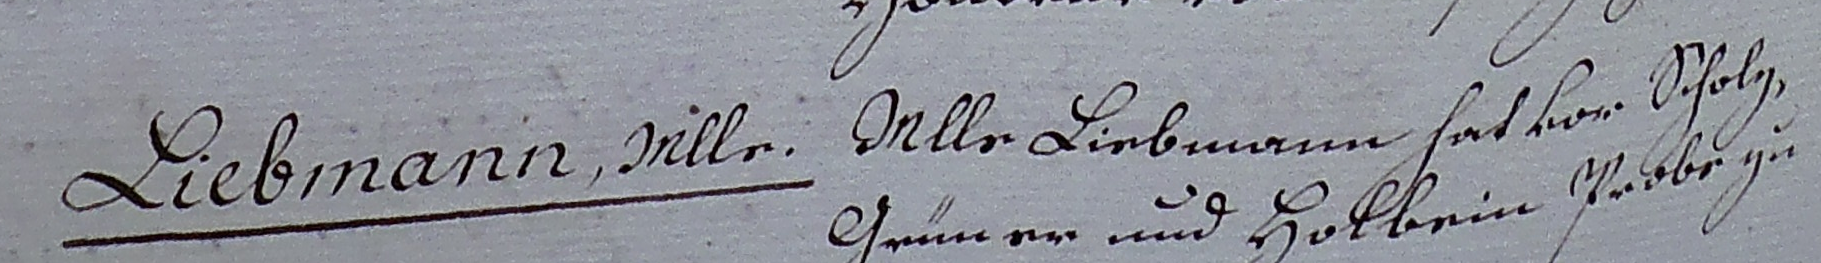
Liebmann, Mlle. Mlle Liebmann hat vor Scholz,
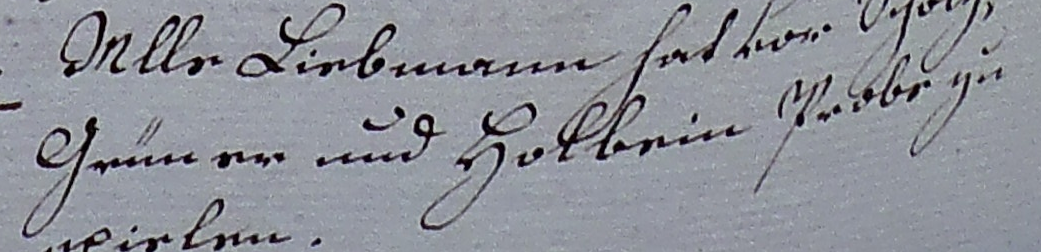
Grüner und Holbein Probe zu
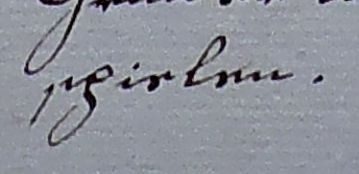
spielen.
